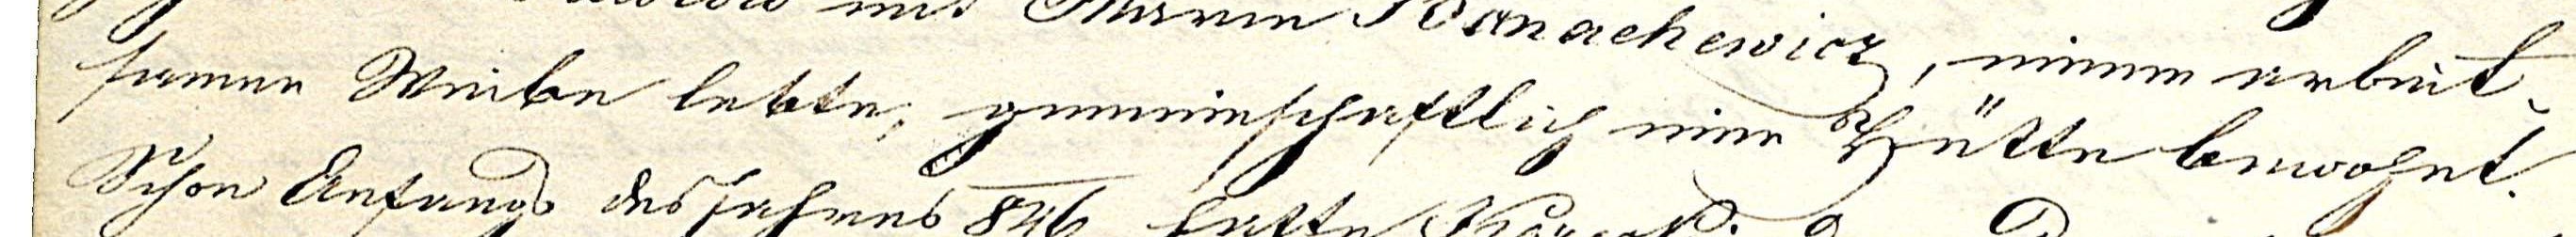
samer Weibe lebte, gemeinschaftlich eine Hütte bewohnt.
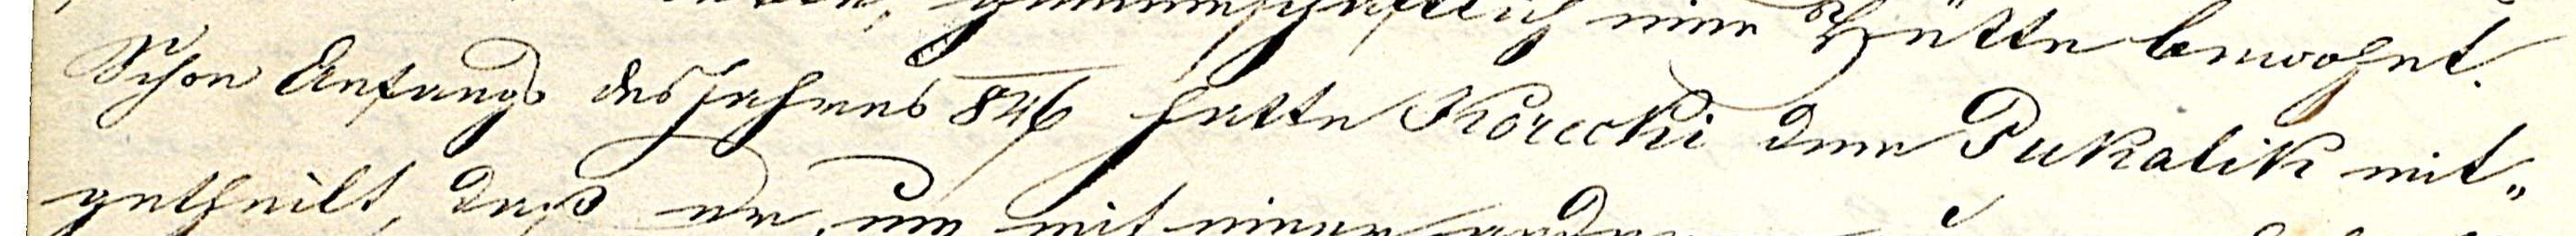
Schon Anfangs des Jahres 846 hatte Korecki dem Pukalik mit¬
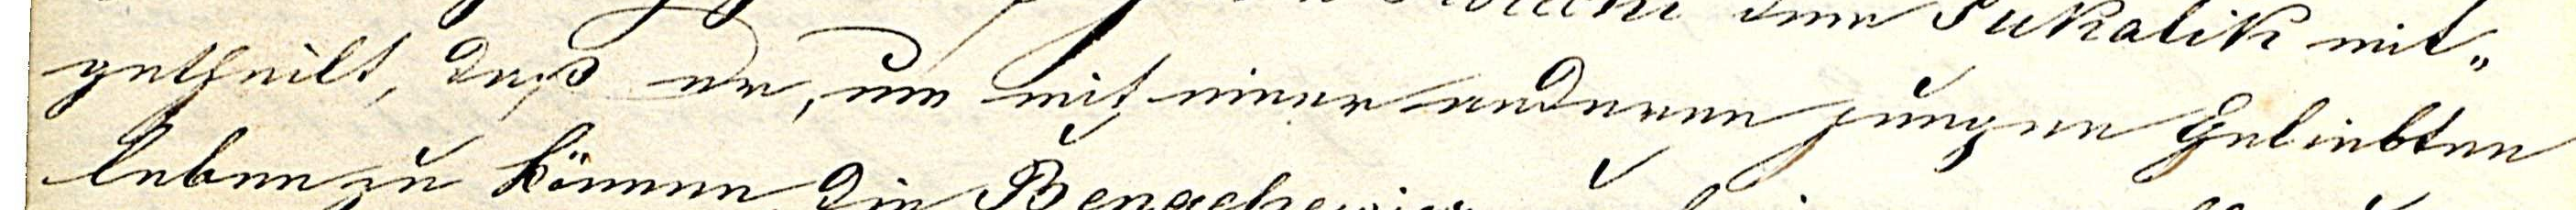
getheilt, daß er, um mit einer anderen Jungen Geliebten
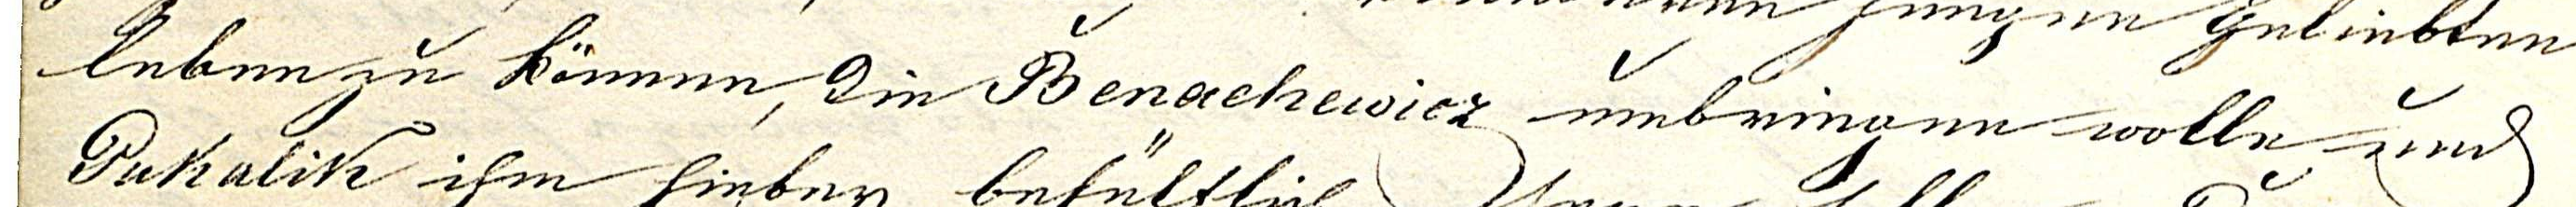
leen zu können, die Benachewicz umbringen wolle und
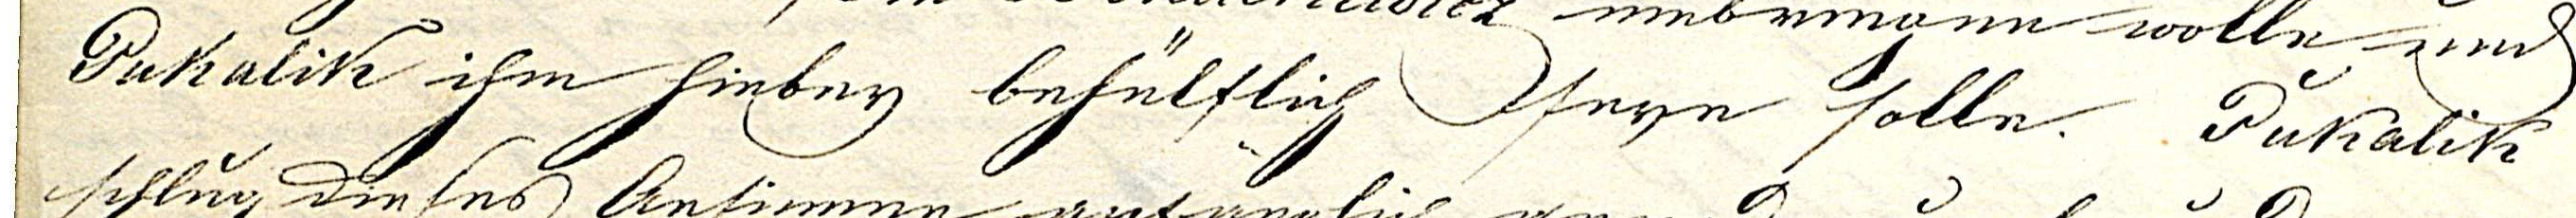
Pukalik ihm hiebey behülflich seve solle. Pukalik
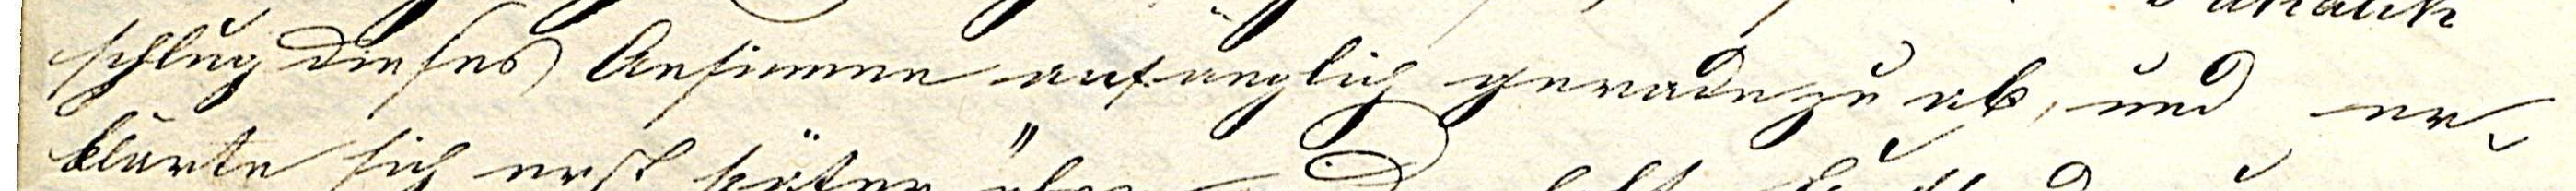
schlug dieses Aesimme anfänglich gerade zu ab, und er¬
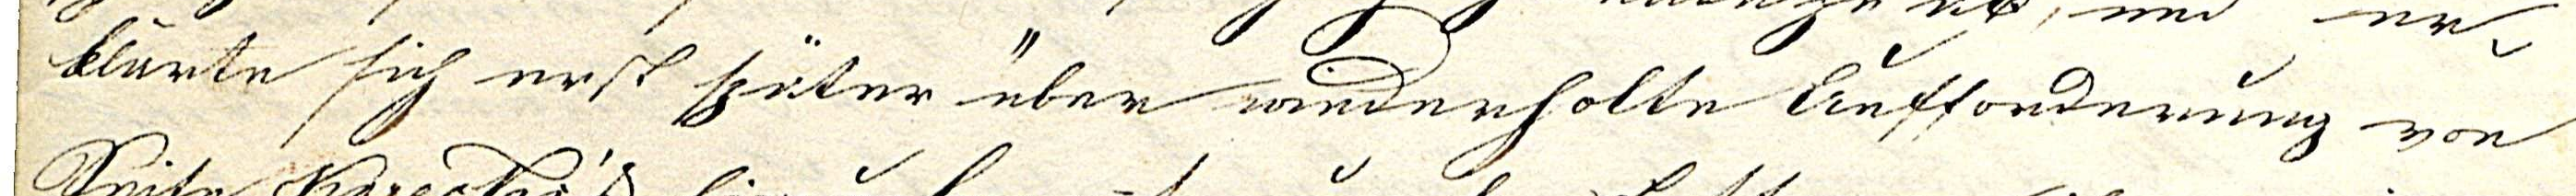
klärte sich erst später über wiederholte Aufforderung von
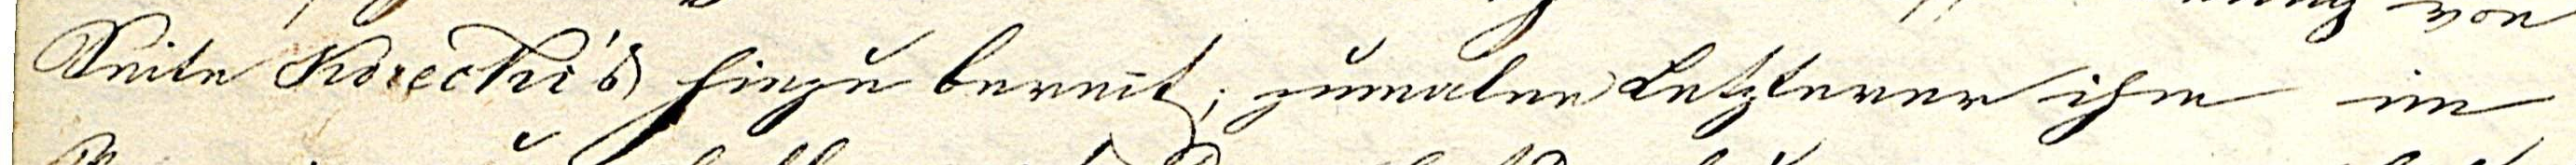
Seite Korecki's hiezu bereit; zumalen Letzterer ihm im
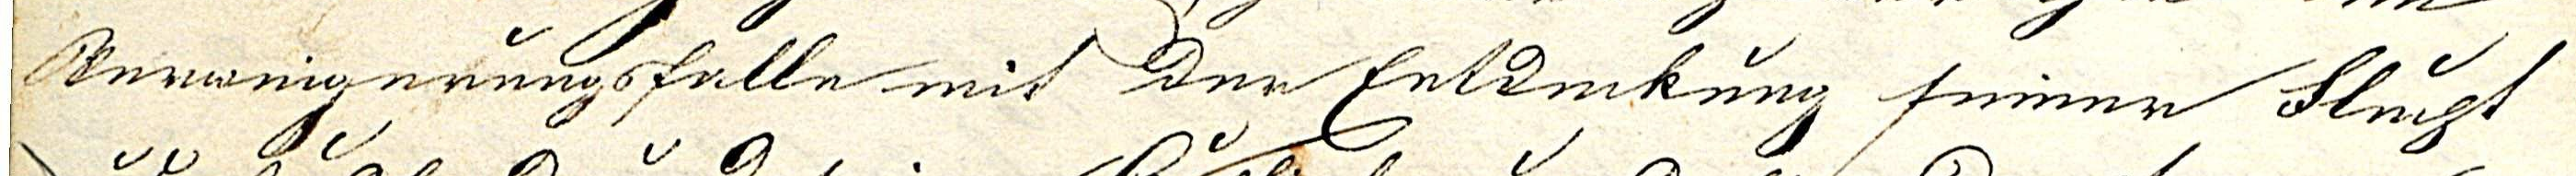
Verweigerungsfalle mit der Entdeckung seiner Flucht
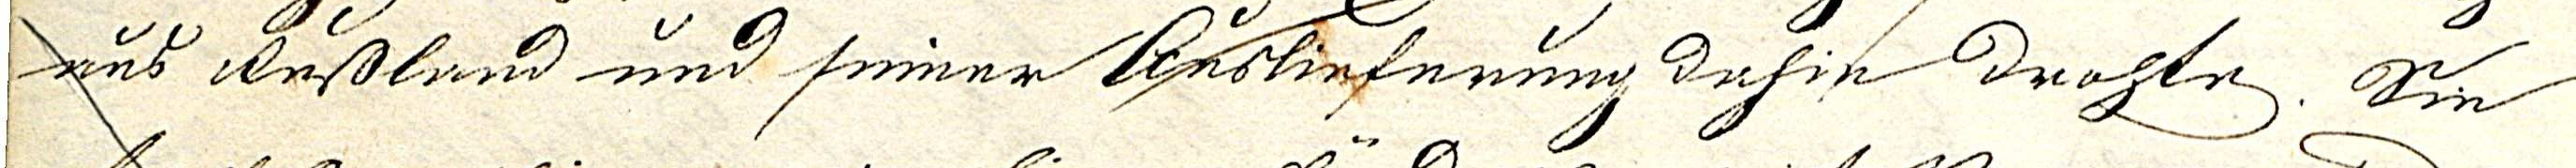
aus Ausland und seiner Auslieferung dahin Drohte. Sie
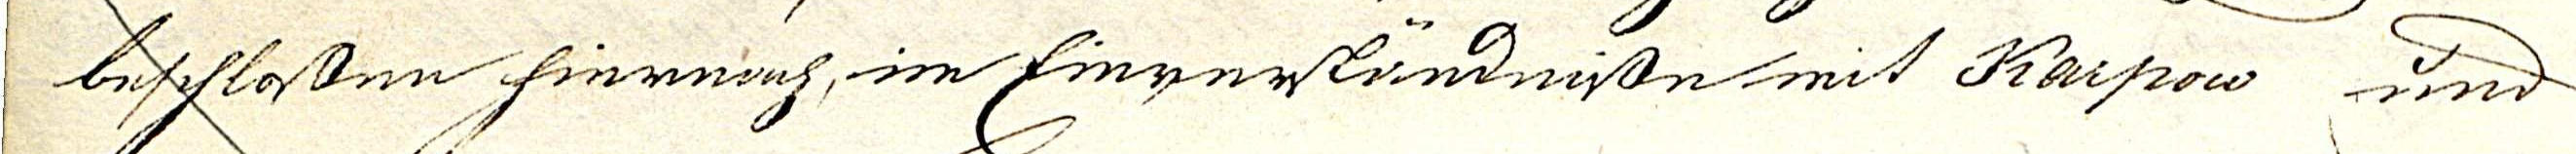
beschloßen hiernach, im Einverständniße mit Karpow und
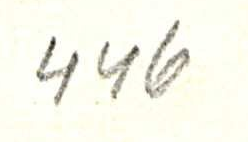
446
